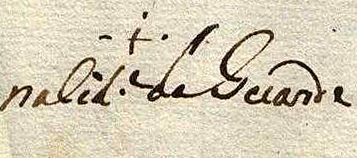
na Cid.e de Guarda
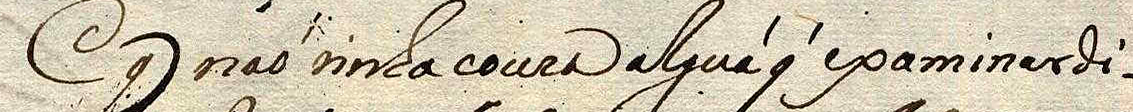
e q̄ naõ tinha couza alguā q̄ examinar di
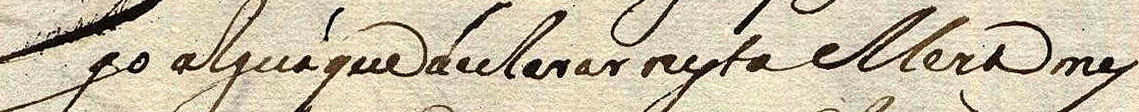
go alguā que declarar nesta Mesa mas
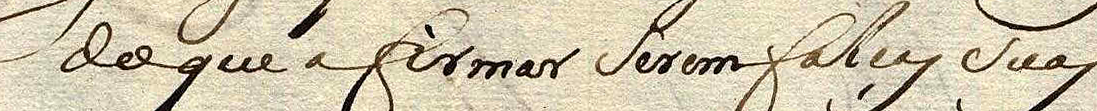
do que afirmar serem falças suas
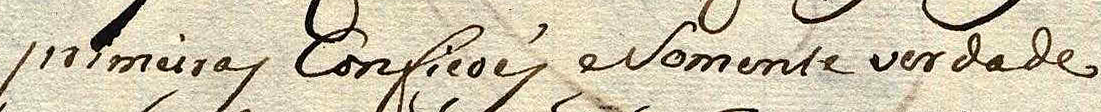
primeiras Confiçoẽs, e Somente verdade
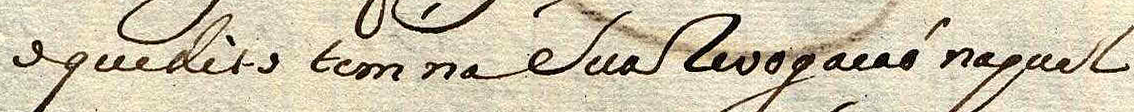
o que dito tem na Sua Revogaçaõ na qual
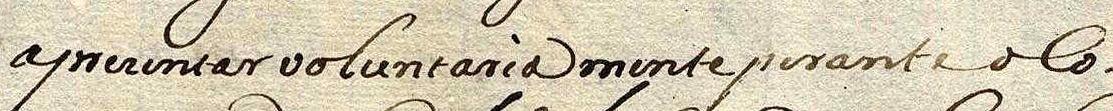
aprezentar voluntariamente perante o Co
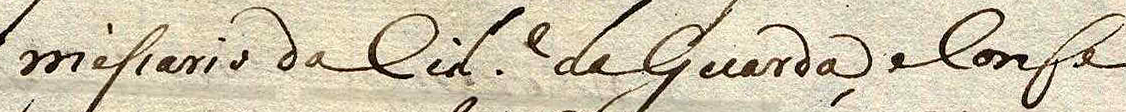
missario da Cid.e da Guarda, e Confe
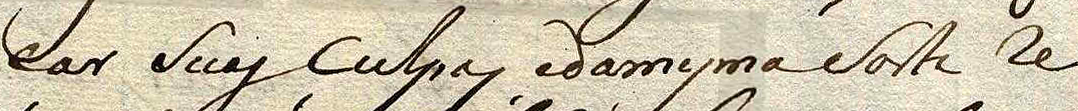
çar Suas culpas, e da mesma Sorte Re
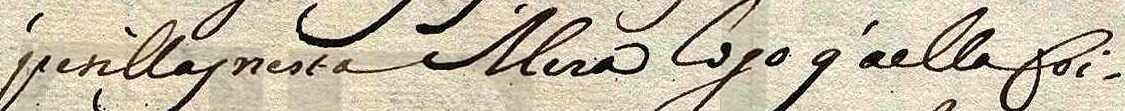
petillas nesta Meza logo q̄ a ella foi
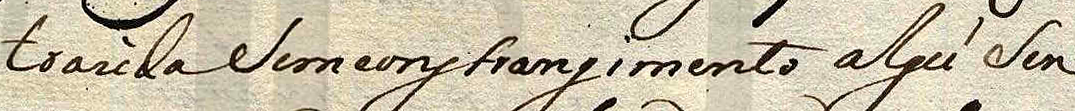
trazida Sem constrangimento algū Sen
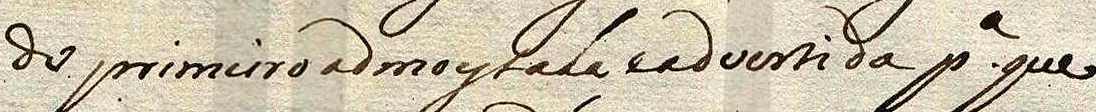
do primeiro admoestada e advertida p.a que
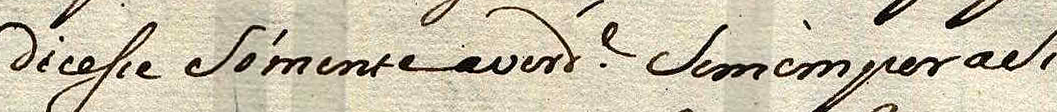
dicesse Sómente a verd.e Sem impor a Si
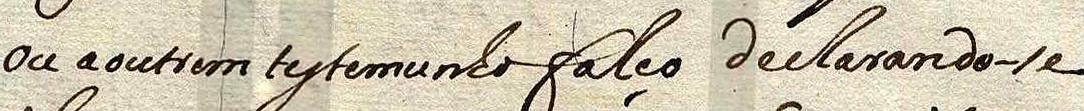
ou a outrem testemunho falço declarando-se
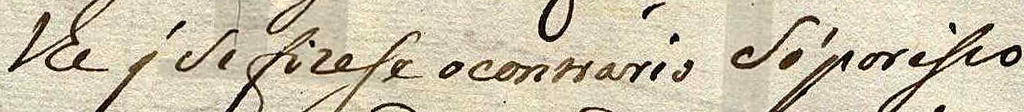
lhe q̄ se fizese o contrario Só por isso
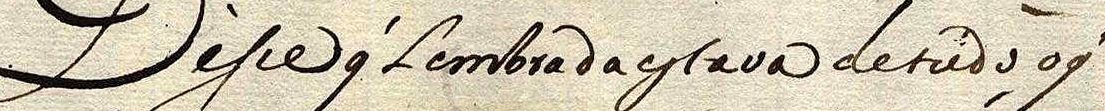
Disse q̄ Lembrada estava de tudo, o q̄
